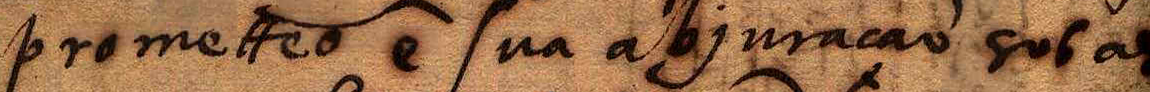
prometteo ē sua abjuração sob as
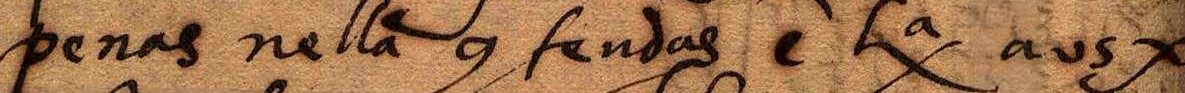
penas nella ꝯteudas ē LXa aos x
